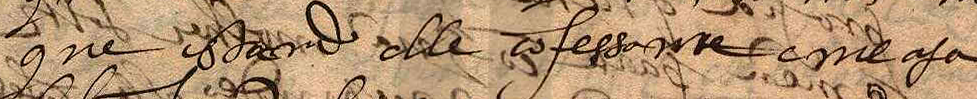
que estando elle cōfessante em casa
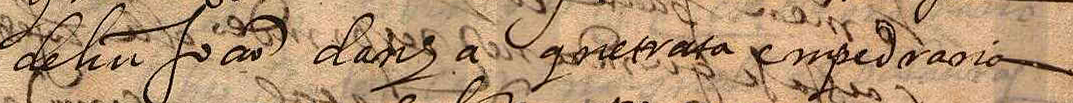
de hū Joaõ danha que trata em pedraria
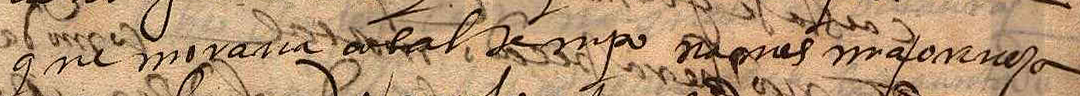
que moraua ao tal tempo na mesma / oriueza
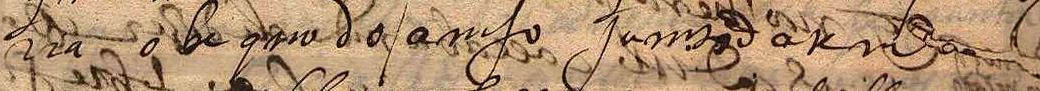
ria o bequo do / amJo Jumto a temda
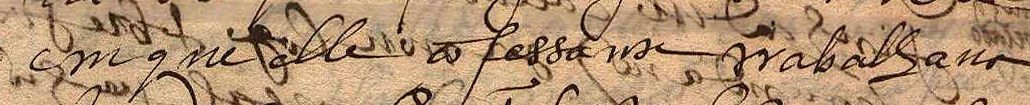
em que elle cōfessante trabalhaua
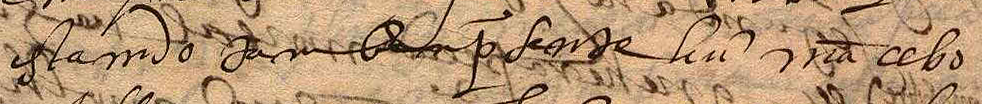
estando tambem p̄sente hū mācebo
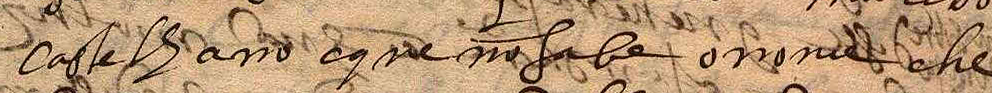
castelhano e que nō sabe o nome e he
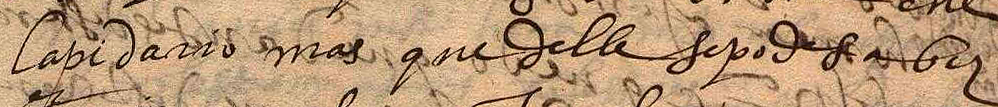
lapidario mas que delle se pode saber
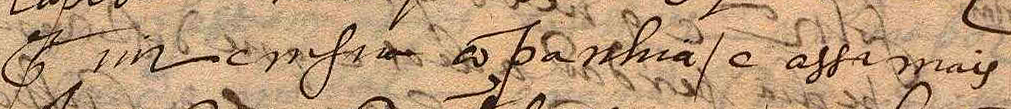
por uir em sua cōpanhia / e assi mais
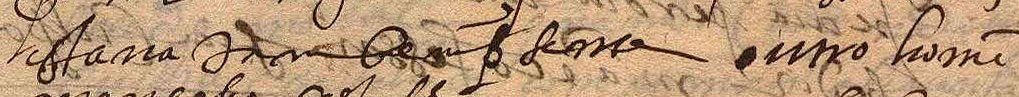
estaua tambem p̄sente outro homē
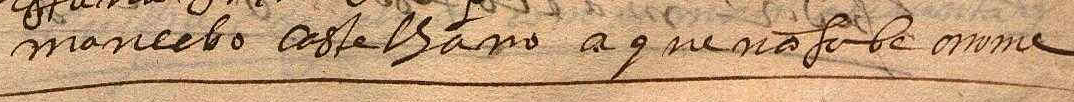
mancebo castelhano a que naõ sabe o nome
